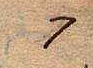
7
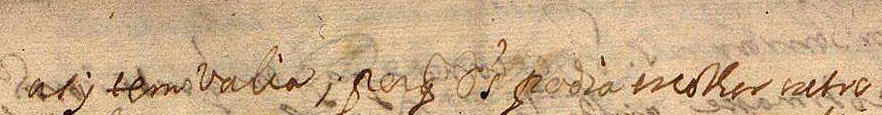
asy tem valia, porq̄ Ds̄ podia escolher outro
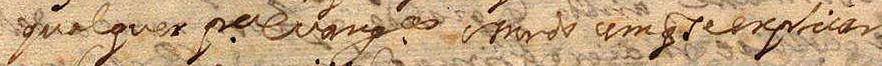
qualquer p.a evang.a o modo com q̄ se explicar
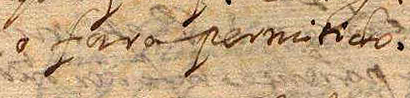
o fora permitido.
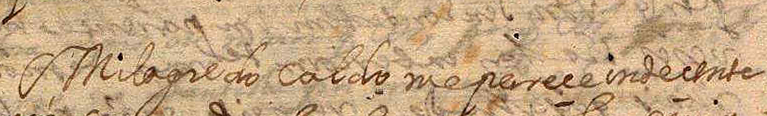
O Milagre do caldo me parece indecente
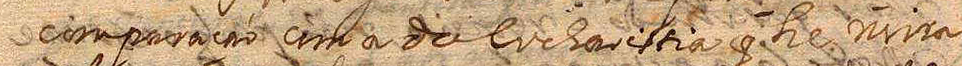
comparaçaõ com a da Evcharistia q̄ he mira
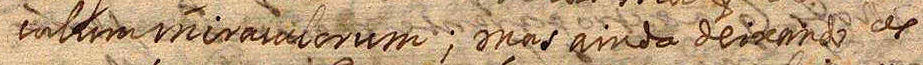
culum miraculorum; mas ainda deixando as
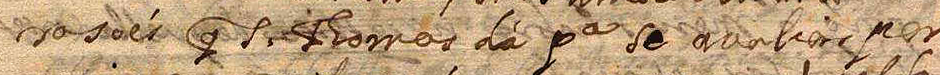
rasoẽs q̄ S. Thomas dá pa se aualiar por
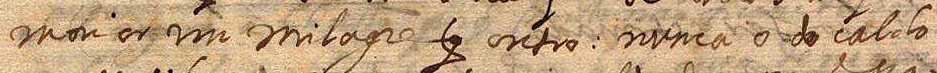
maior vm milagre q̄ outro: nunca o do caldo
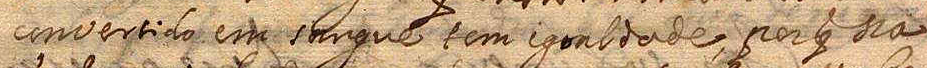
convertido em sangue tem igoaldade, porq̄ na
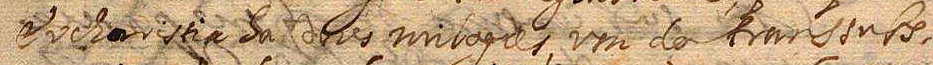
Evcharistia ha dous milagres, vm da transsubs
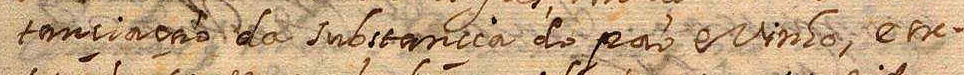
tanciaçaõ da substancia do paõ e vinho, e ou
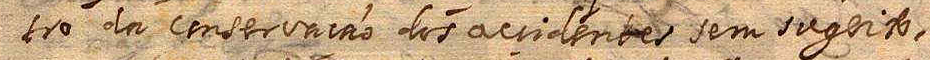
tro da conservaçaõ dos accidentes sem sugeito,
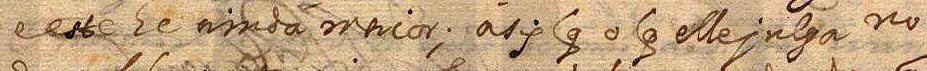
e este he ainda maior; asy q̄ o q̄ elle julga no
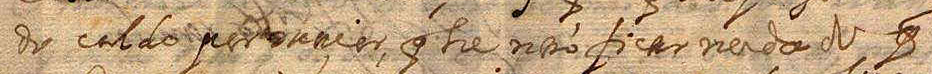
do caldo per maior, q̄ he naõ ficar nada do q̄
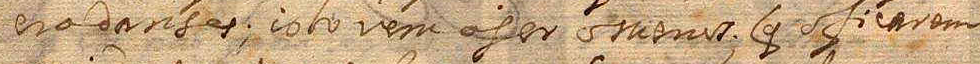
era dantes; isto vem a ser o menos; q̄ o ficarem
